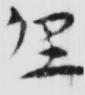侳
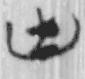山
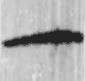一
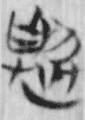○（舉）
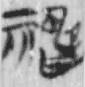禱
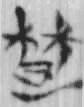楚
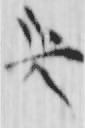先
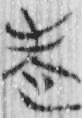老
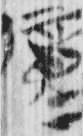僮
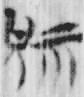祝
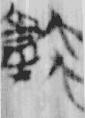○（融）
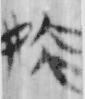毓（鬻）
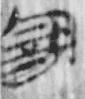酓（鬻）
